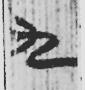九
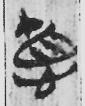惪
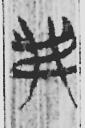弗
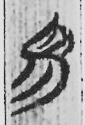易
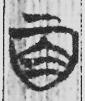百
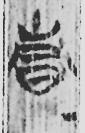青
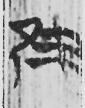隹
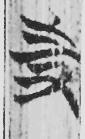寺
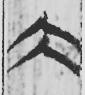大
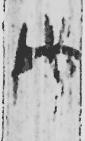戊
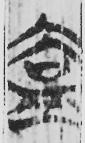盍
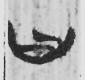曰
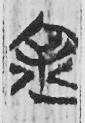余
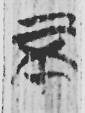不
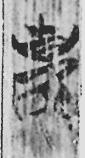尅
